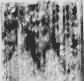羕
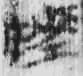陵
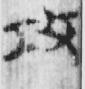攻
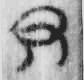尹
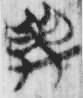與
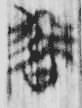喬
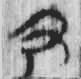尹
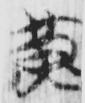黃
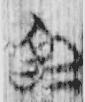爲
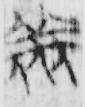羕
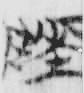陵
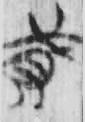貸
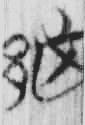○（越）
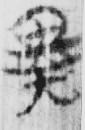異
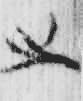之
